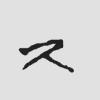氒
